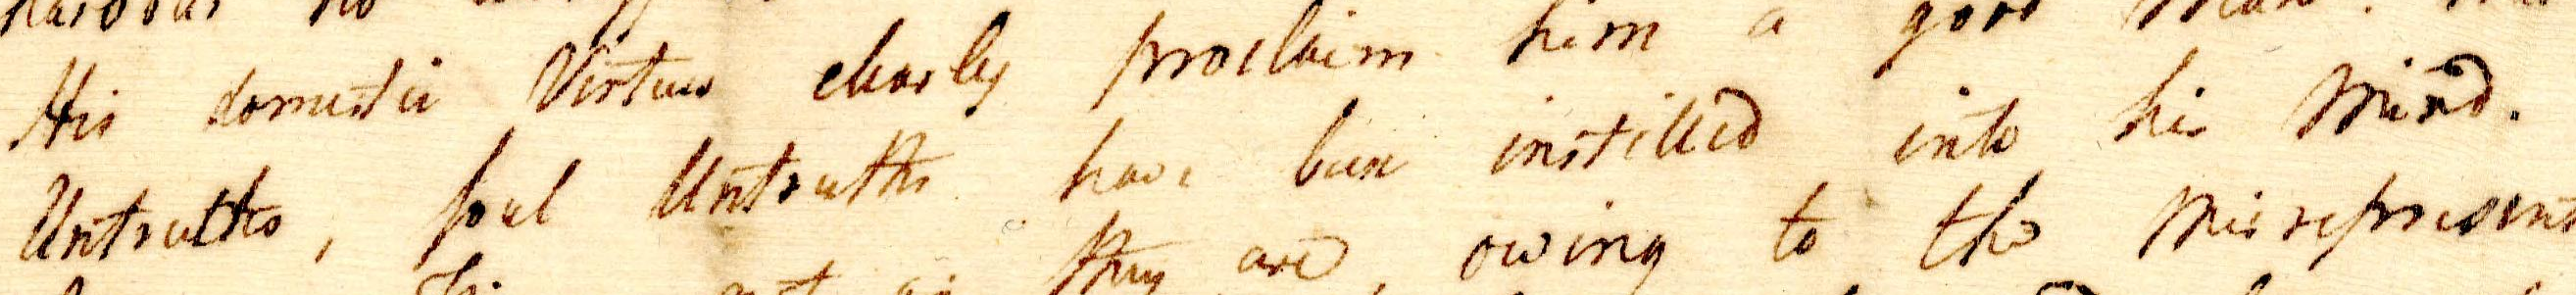Untruths, foul Untruths have been instilled into his Mind.
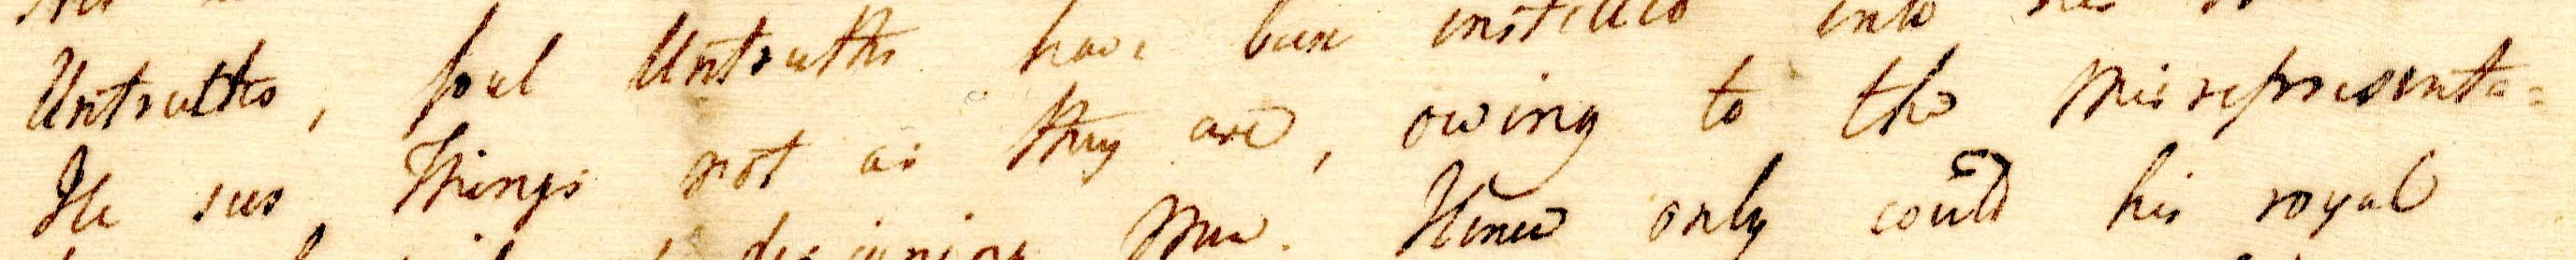He sees Things not as they are, owing to the Misrepresenta-
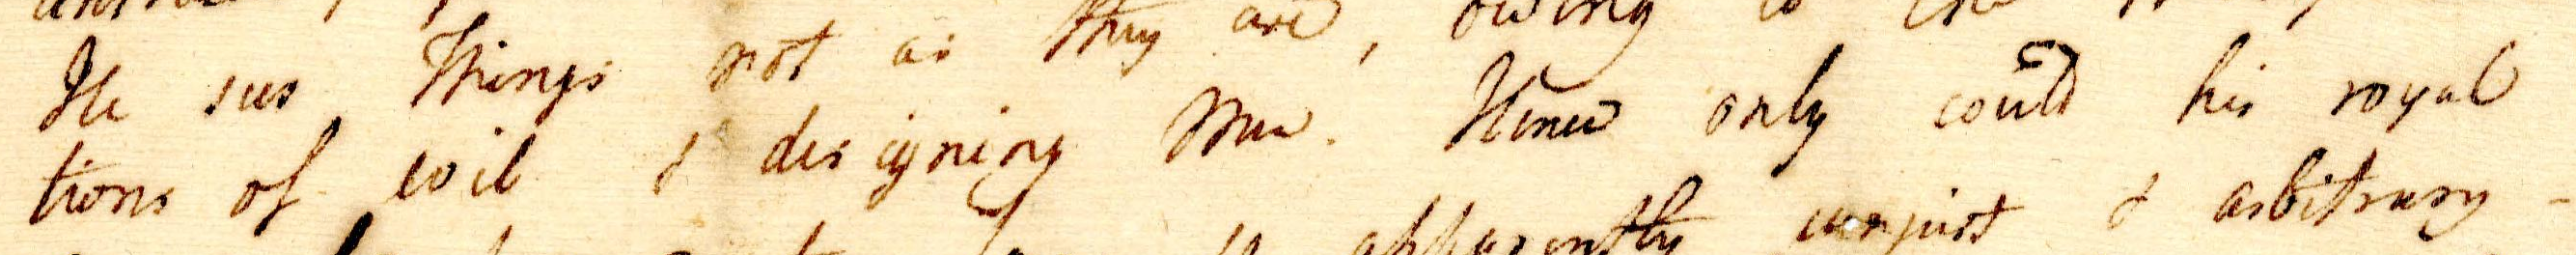tions of evil & designing Men. Hence only could his royal
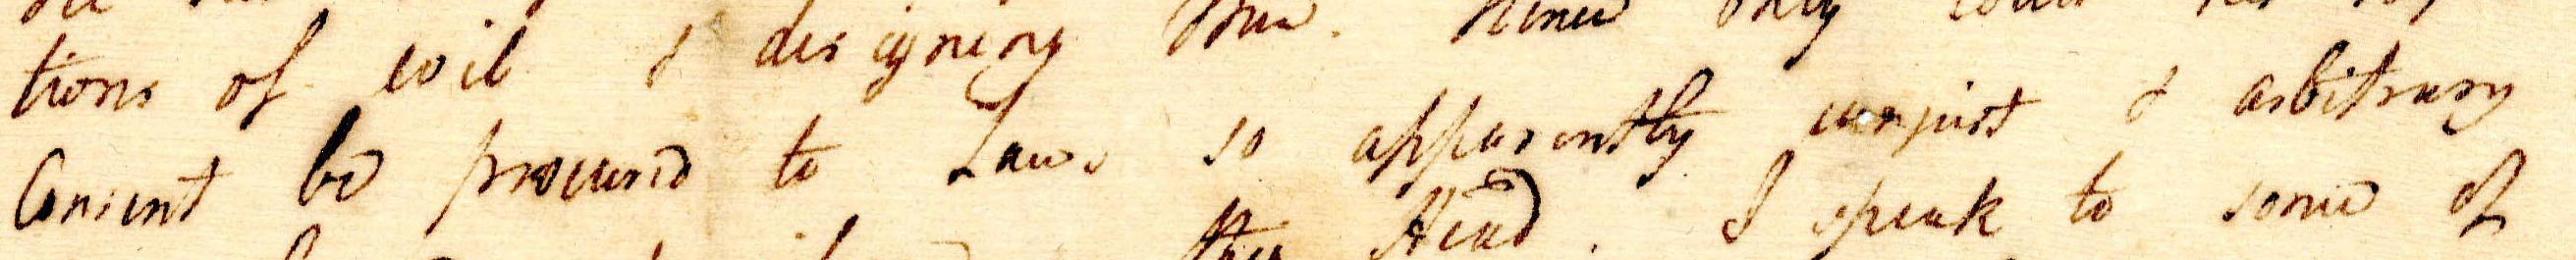Consent be procured to Laws so apparently unjust & abitrary
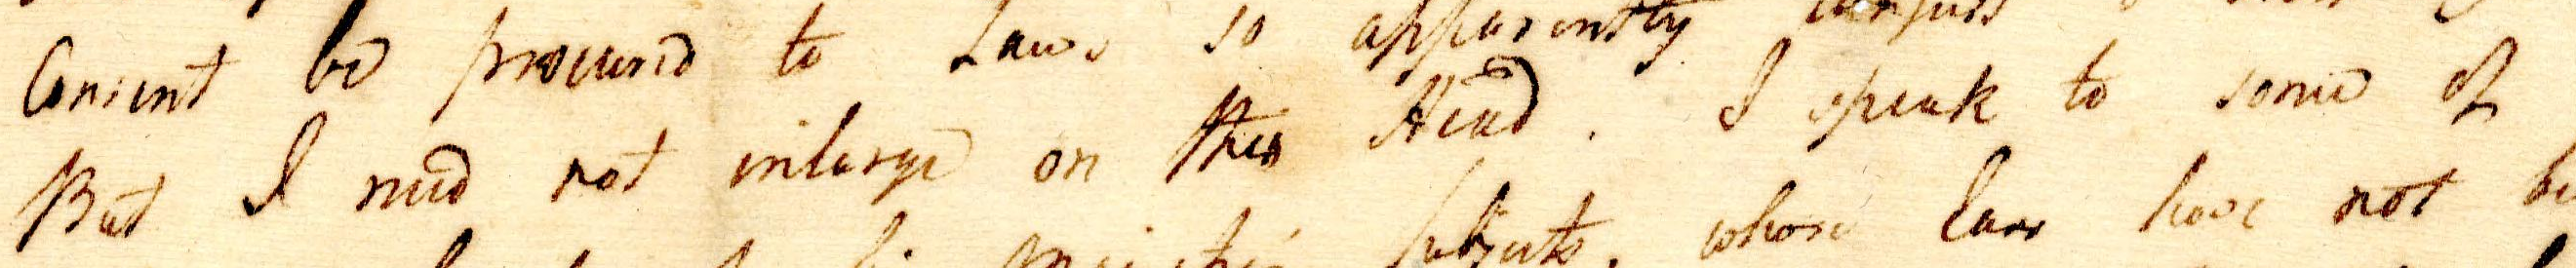But I need not enlarge on this Head. I speak to some of
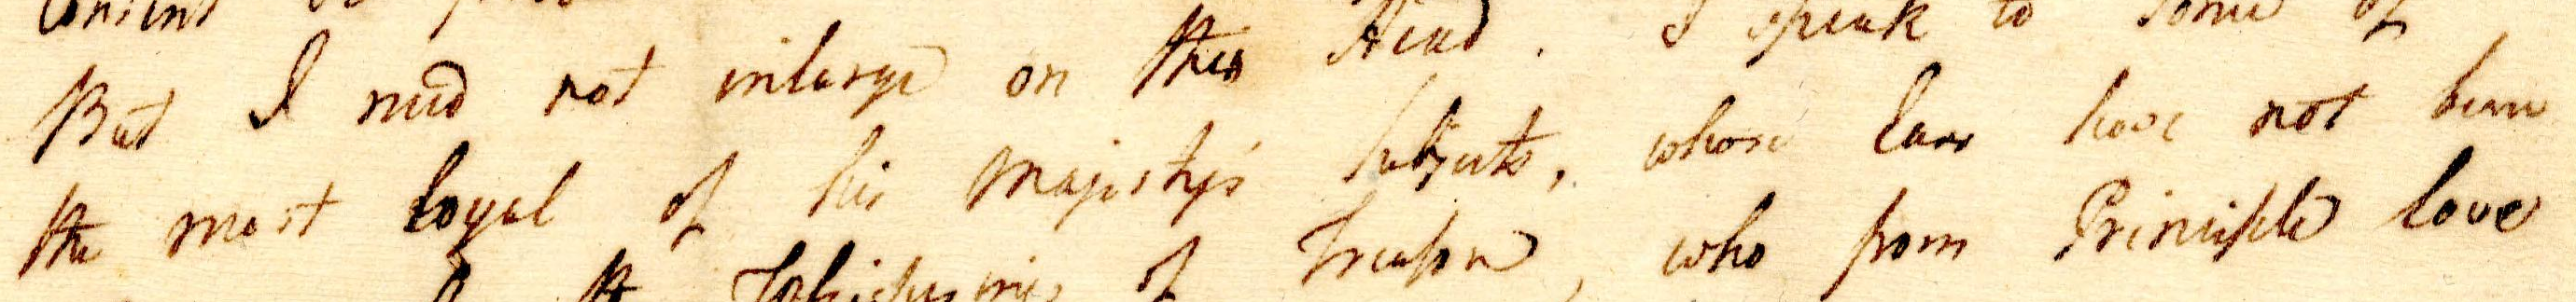the most loyal of his Majesty's Subjects, whose Ears have not been
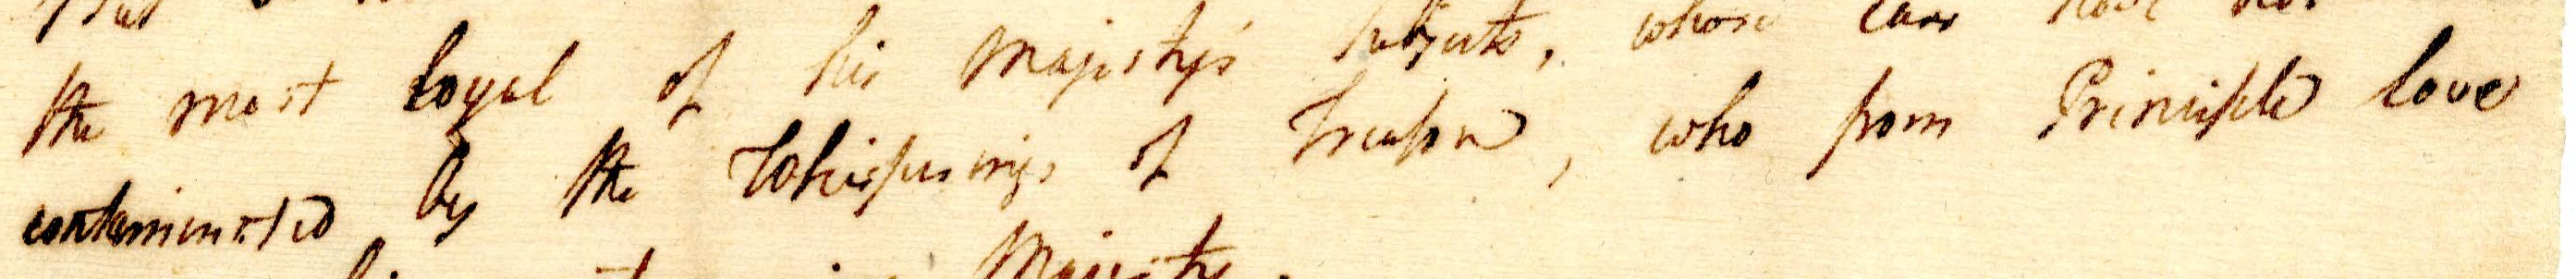contaminated by the Whisperings & Treason, who from Principle love
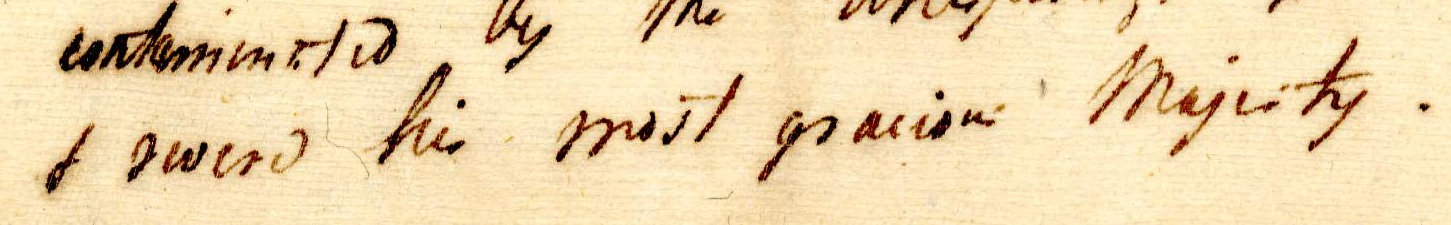& swore his most gracious Majesty.
